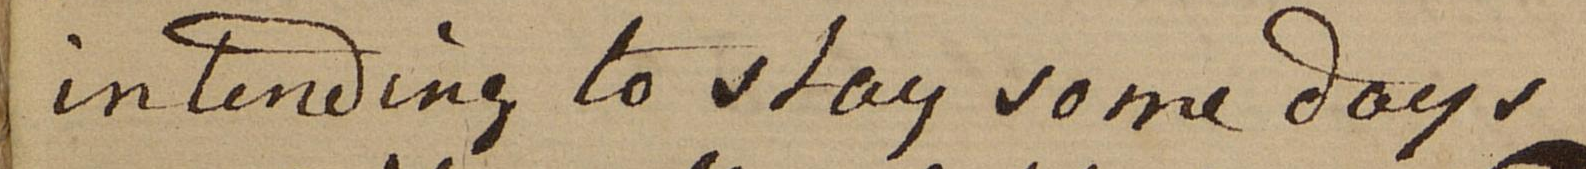intending to stay some days
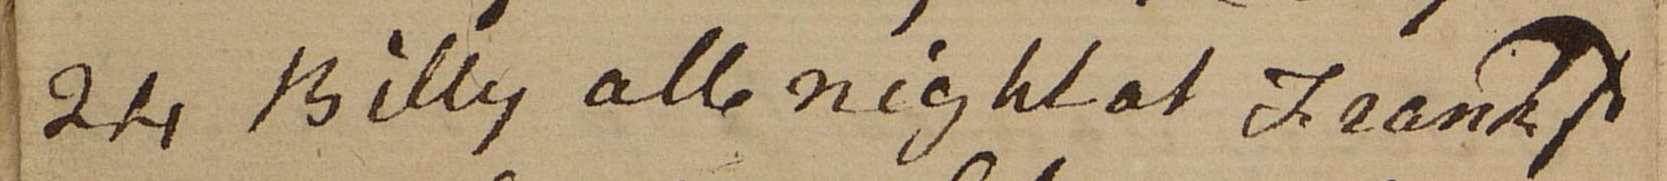24 Billy all night at Frankf
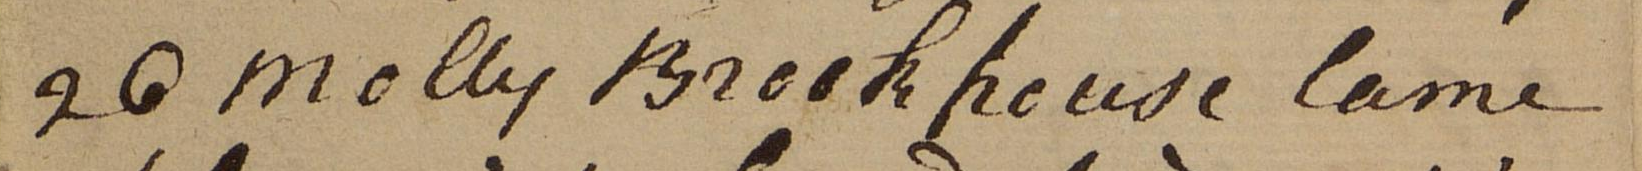20 Molly Brookhouse Came
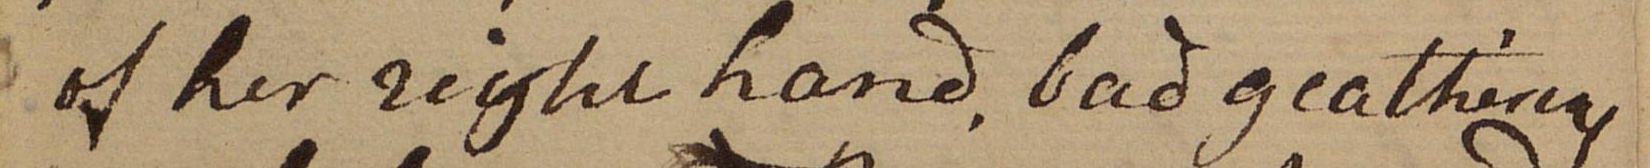of her right hand, bad geathing
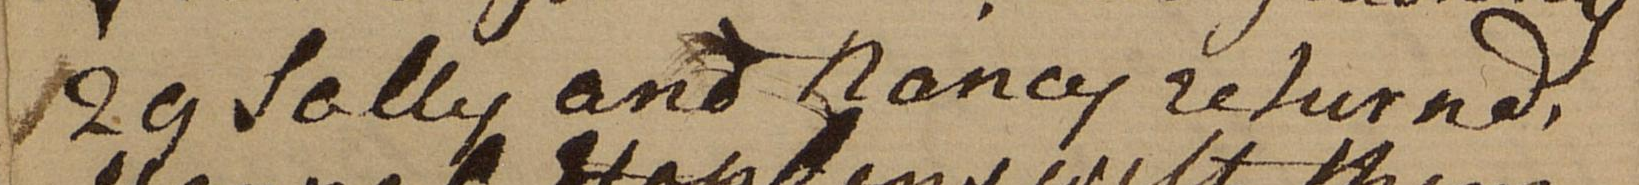29 Sally and Nancy returnd,
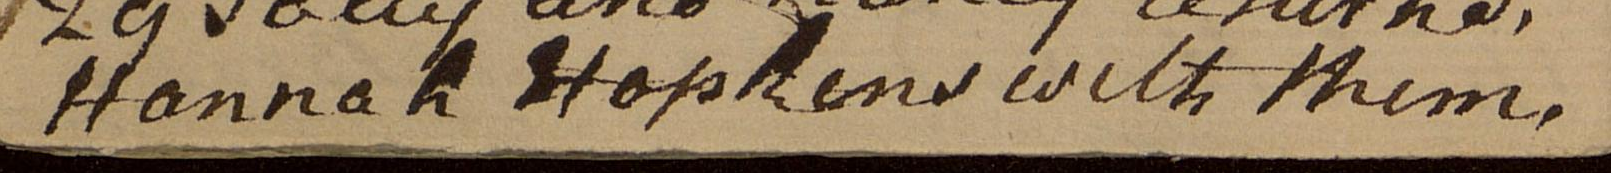Hannah Hopkins with them,
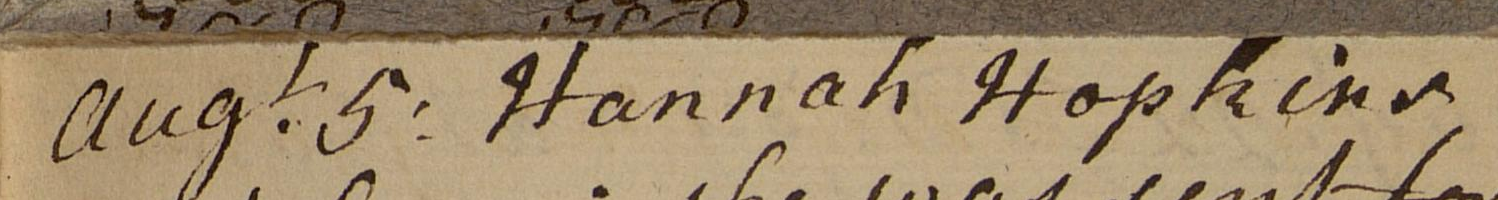Aug^t. 5. Hannah Hopkins
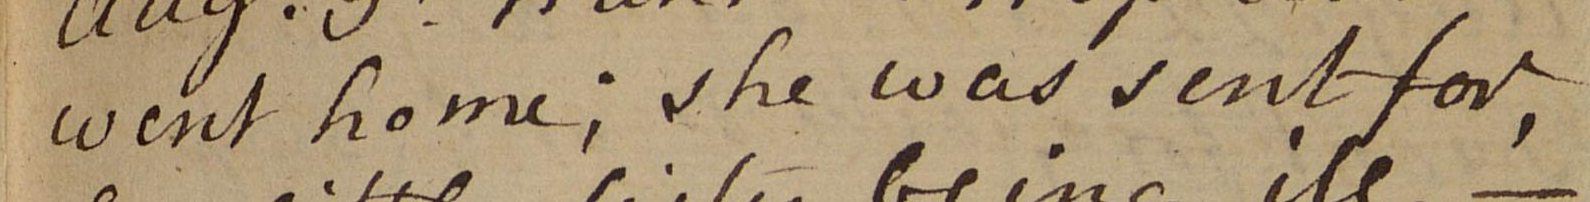went home; she was sent for,
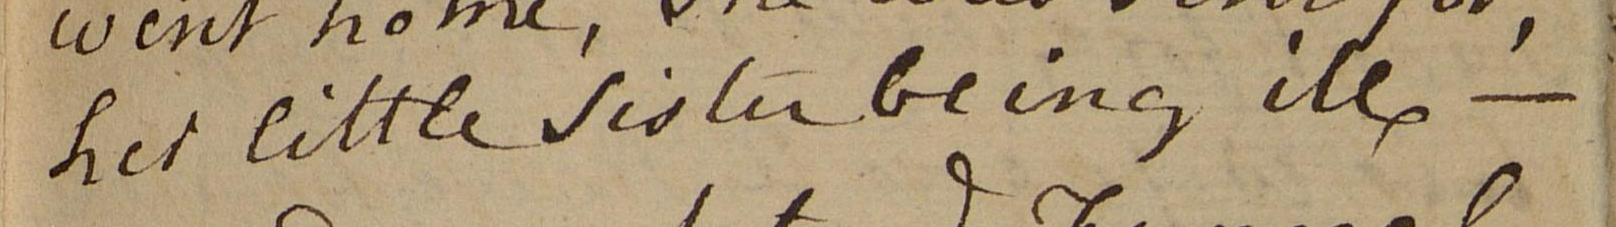her little sister being ill-
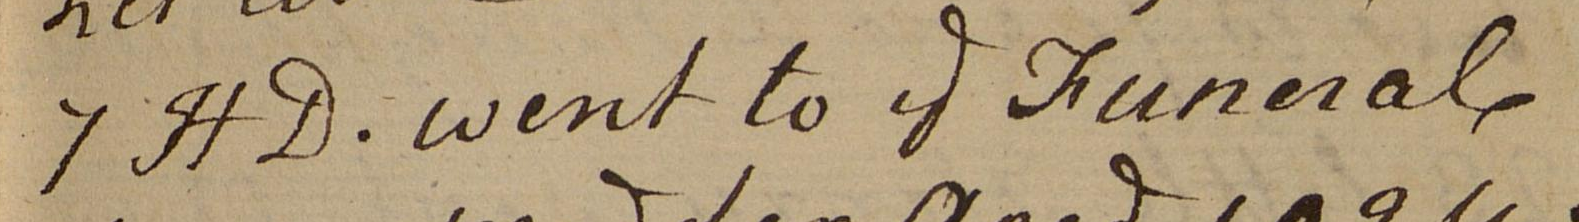7 HD. went to y^e Funeral
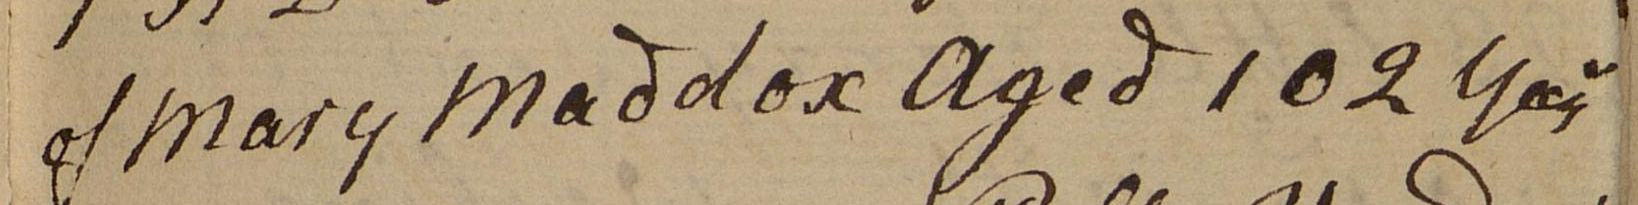of Mary Maddox aged 102 Year^s
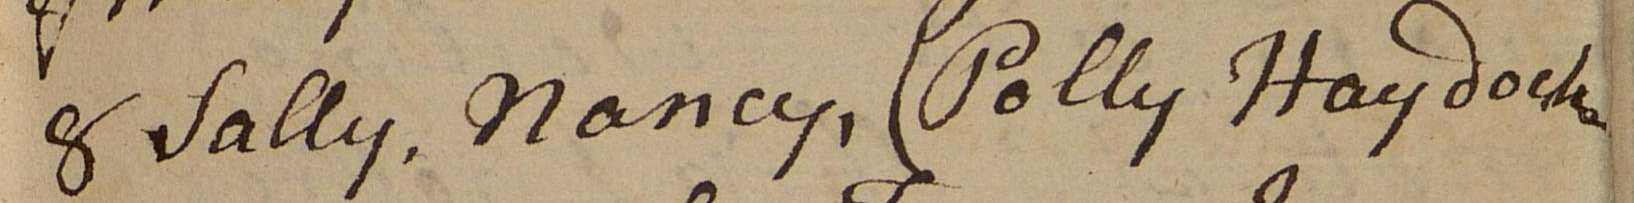8 Sally, Nancy, (Polly Haydock
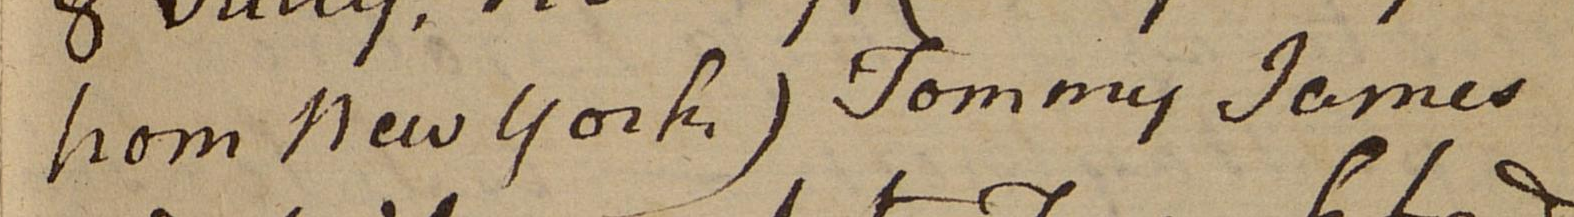from New York) Tommy James
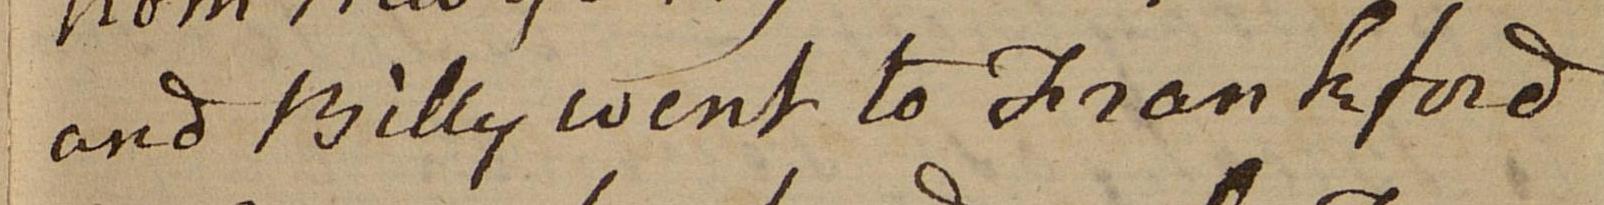and Billy went to Frankford
